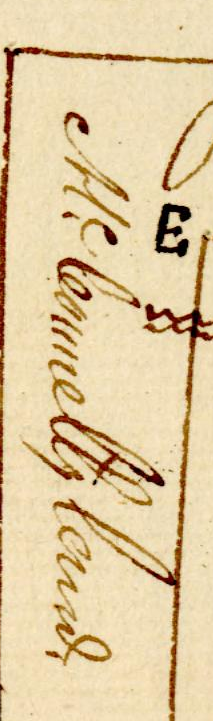M^c.Connelly land
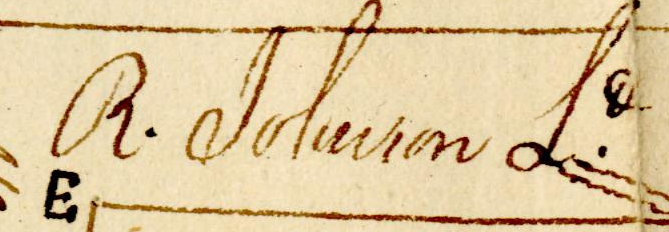R Johnson L^d.
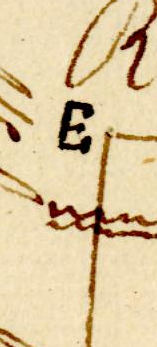E
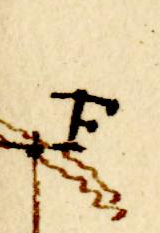F
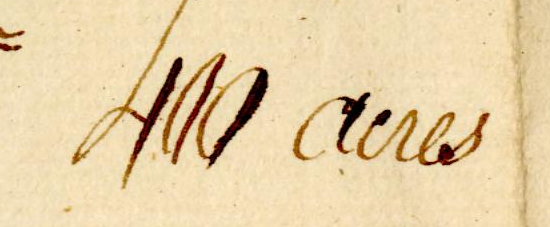400 acres
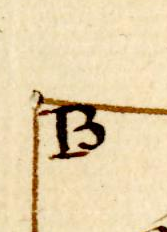B
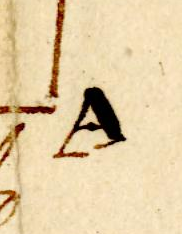A
